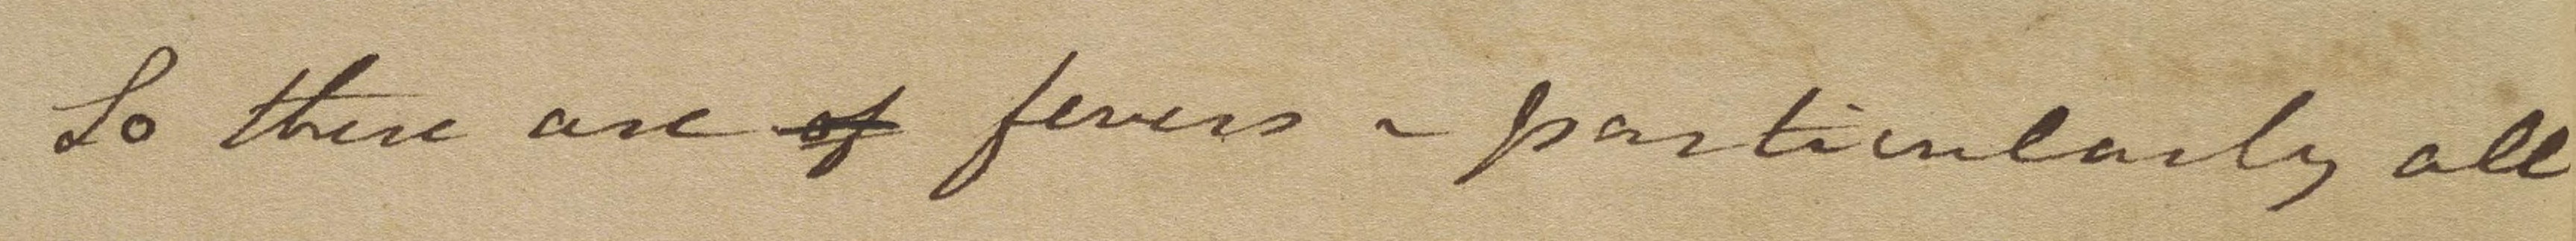So there are [of] fevers- particularly all
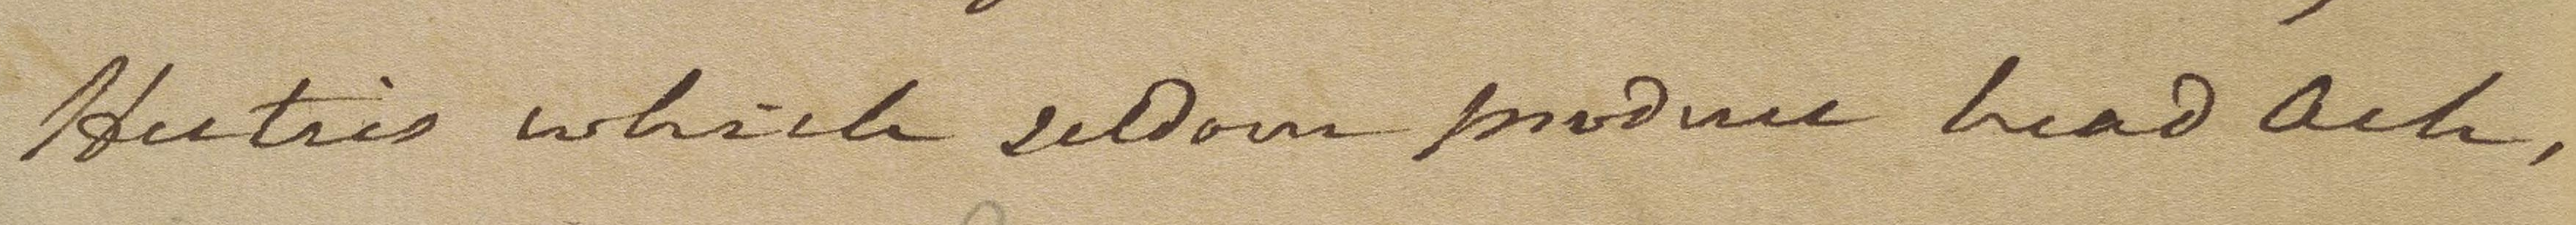Histries which seldom produce headach,
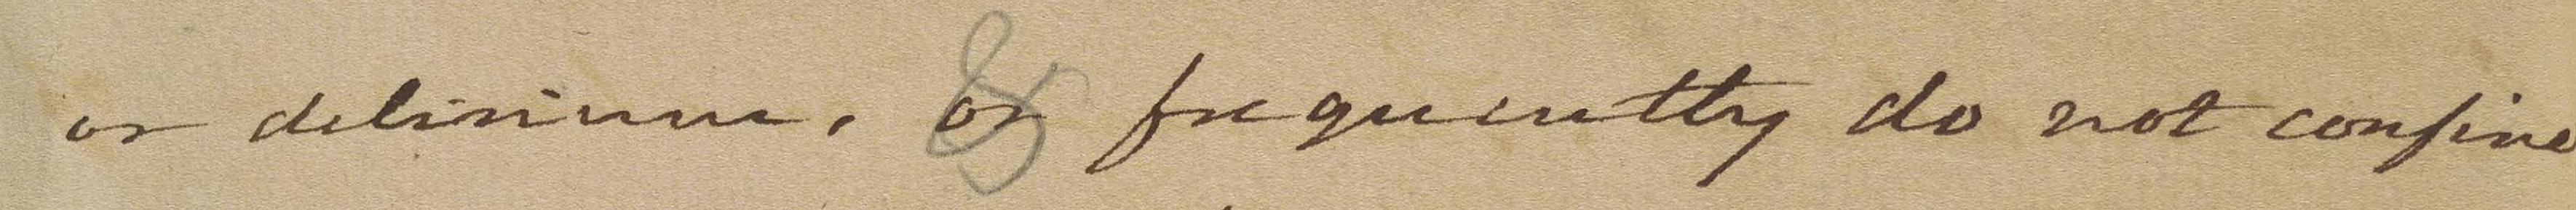or delirium, or frequently do not confine
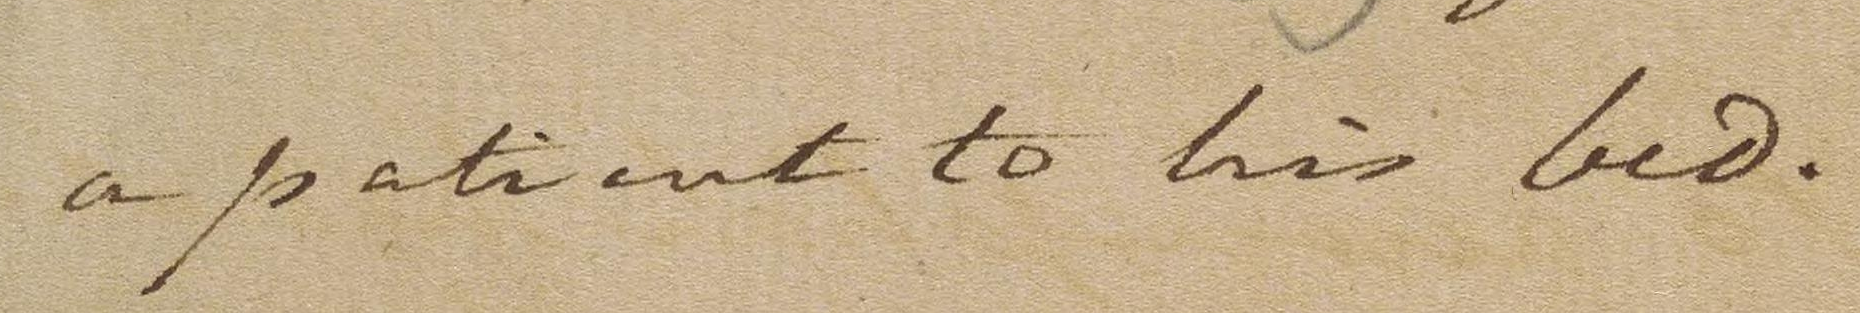a patient to his bed.
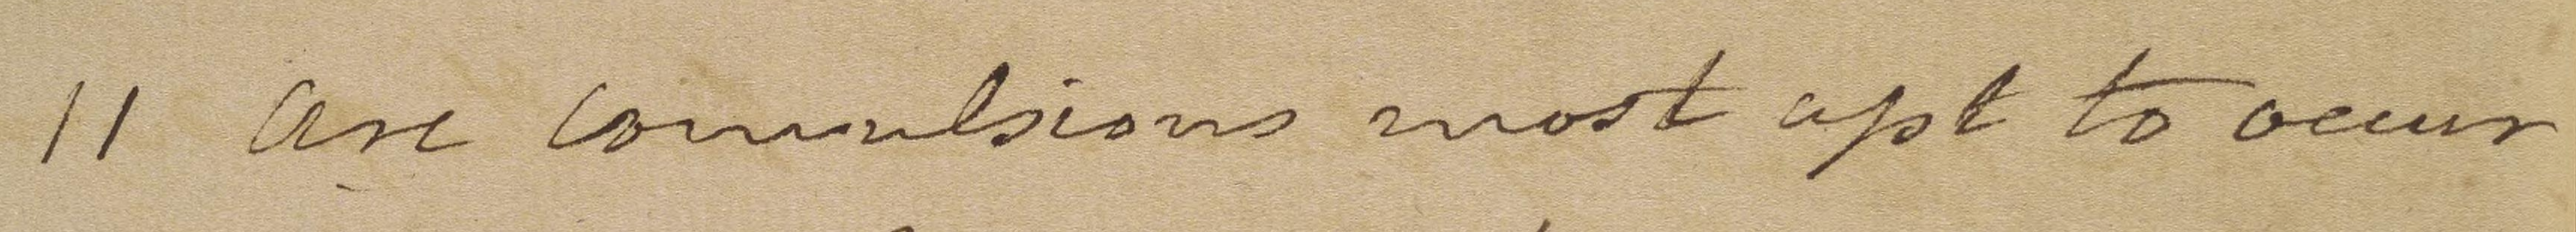11 Are convulsions most apt to occur
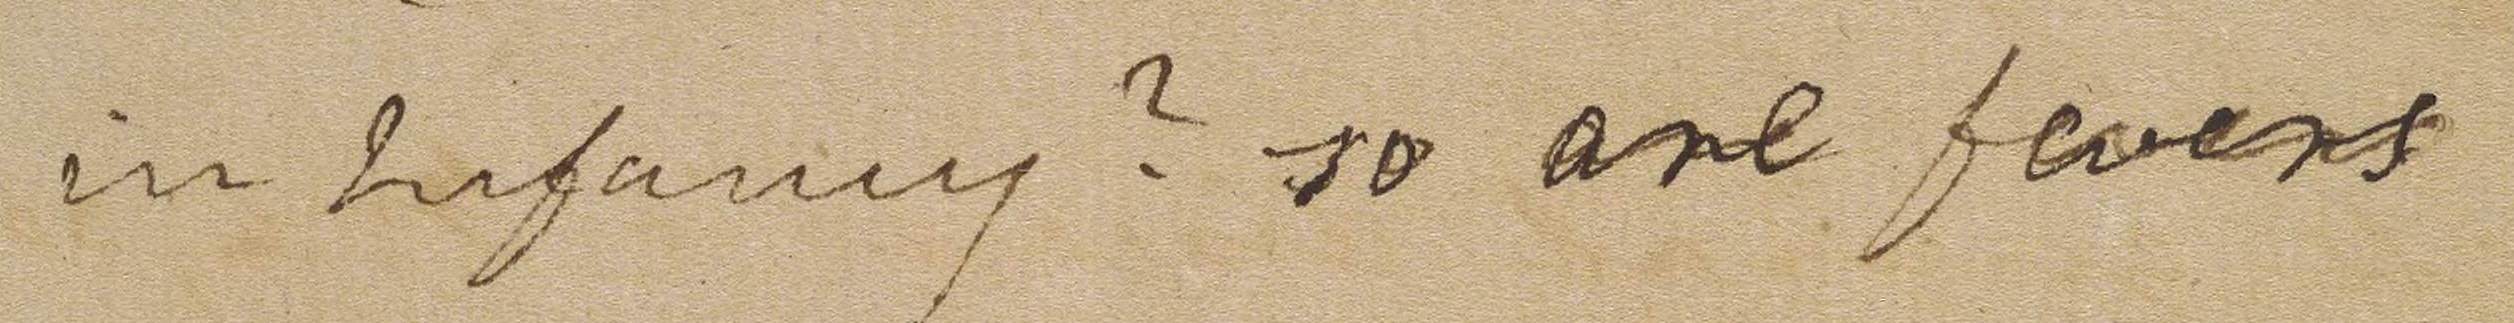in infancy? So are fevers.
